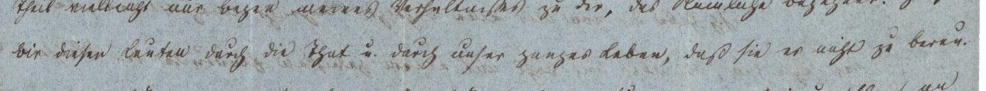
wir diesen Leuten durch die That u. durch unser ganzes Leben, daß sie es nicht zu bereu-
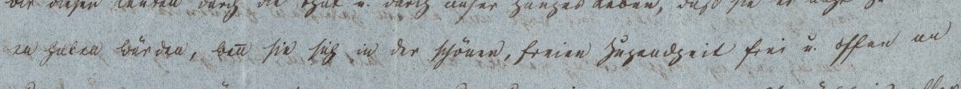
en haben würden, wenn sie sich in der schönen, freien Jugendzeit frei u. offen an
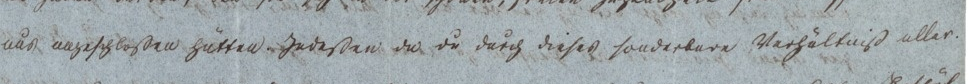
uns angeschlossen hätten. Indessen da Du durch dieses sonderbare Verhältniß aller-
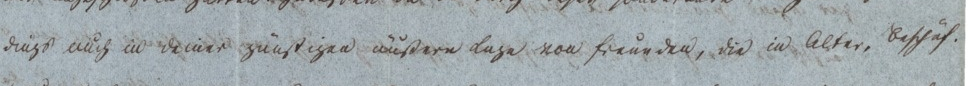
dings auch in Deiner günstigen äußern Lage von Freunden, die in Alter, Beschäf-
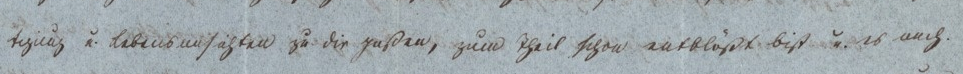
tigung u. Lebensansichten zu Dir passen, zum Theil schon entblößt bist u. es nach-
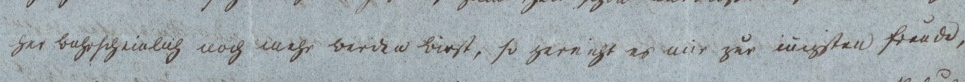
her wahrscheinlich noch mehr werden wirst, so gereicht es mir zur innigsten Freude,
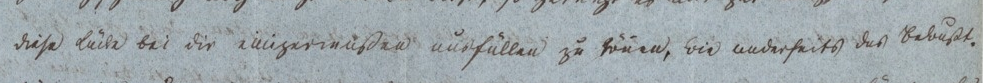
diese Lücke bei Dir einigermaßen ausfüllen zu können, wie anderseits das Bewußt-
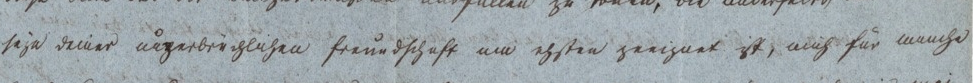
seyn Deiner unzerbrechlichen Freundschaft am ehsten geeignet ist, mich für manche
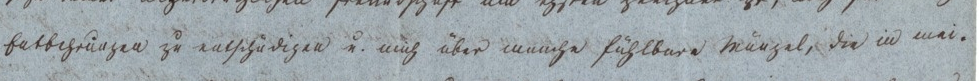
Entbehrungen zu entschädigen u. mich über manche fühlbare Mängel, die in mei-
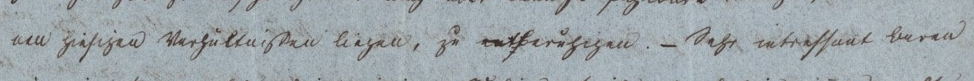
nen hiesigen Verhältnissen liegen, zu entsberuhigen. – Sehr intressant waren
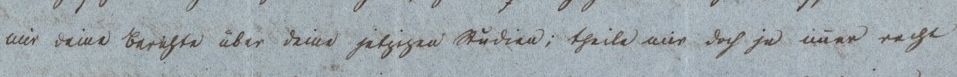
mir Deine Berichte über Deine jetzigen Studien; theile mir doch ja immer recht
